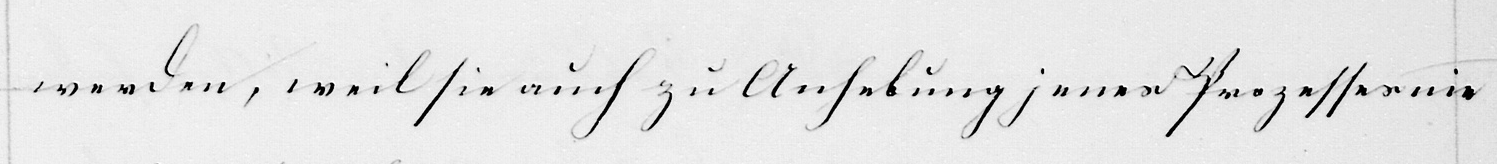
werden, weil sie auch zu Anhebung jenes Prozesses nie
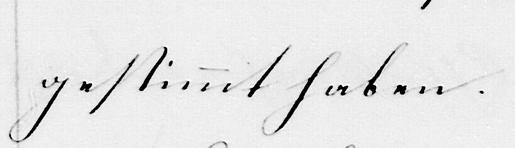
gestimmt haben.
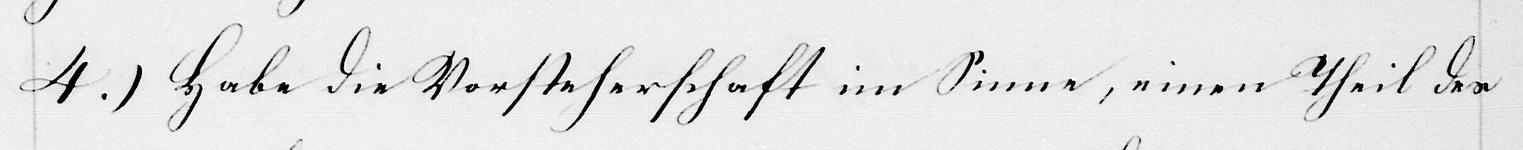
4.) Habe die Vorsteherschaft im Sinne, einen Theil des
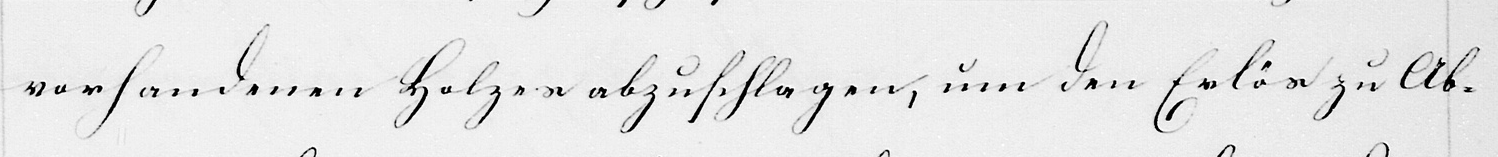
vorhandenen Holzes abzuschlagen, um den Erlös zu Ab¬
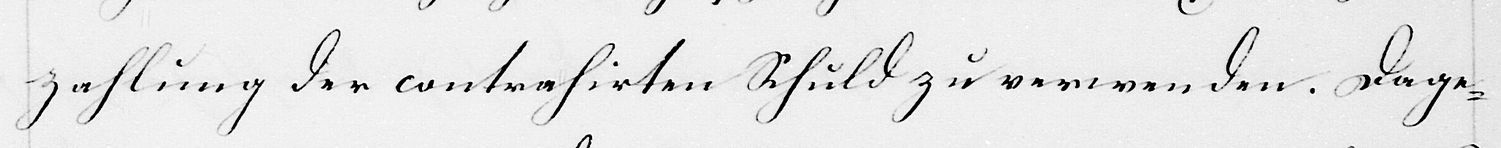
zahlung der contrahirten Schuld zu verwenden. Dage¬
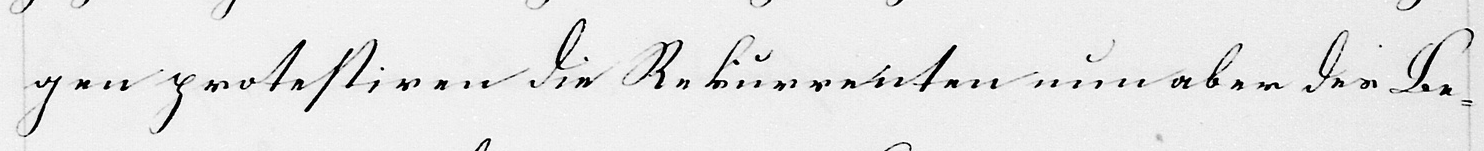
gen protestiren die Rekurrenten nun aber des Be¬
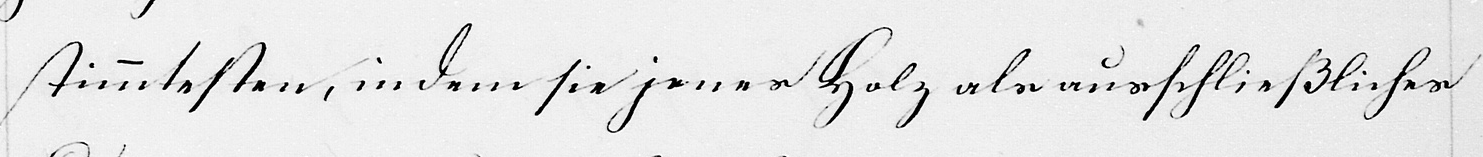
stimmtesten, indem sie jenes Holz als ausschließliches
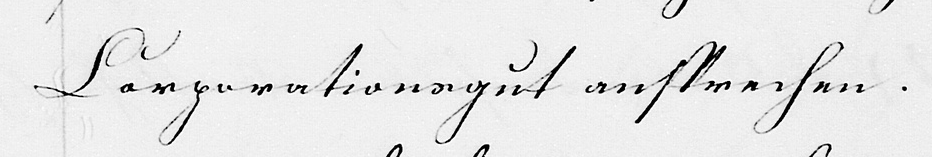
Corporationsgut ansprechen.
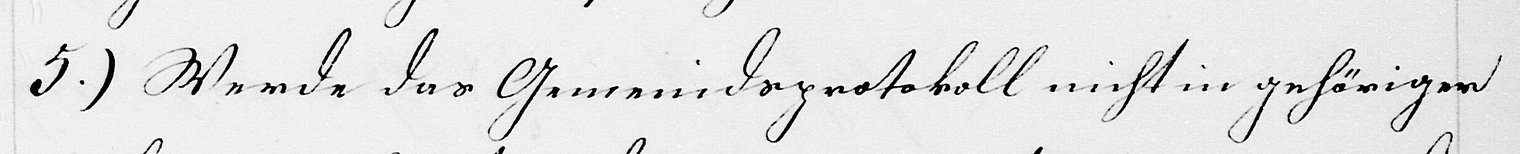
5.) Werde das Gemeindsprotokoll nicht in gehöriger
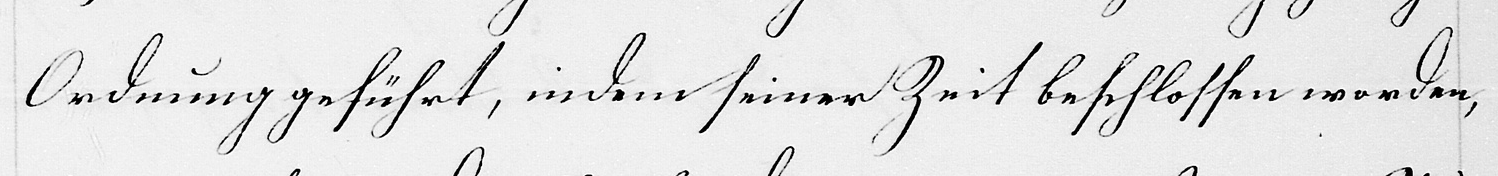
Ordnung geführt, indem seiner Zeit beschlossen worden,
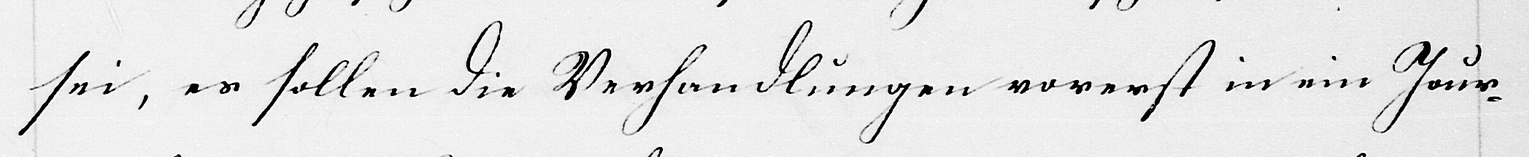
sei, es sollen die Verhandlungen vorerst in ein Jour¬
